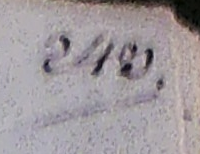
243.
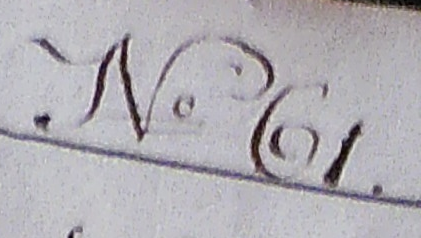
No͇ 61.
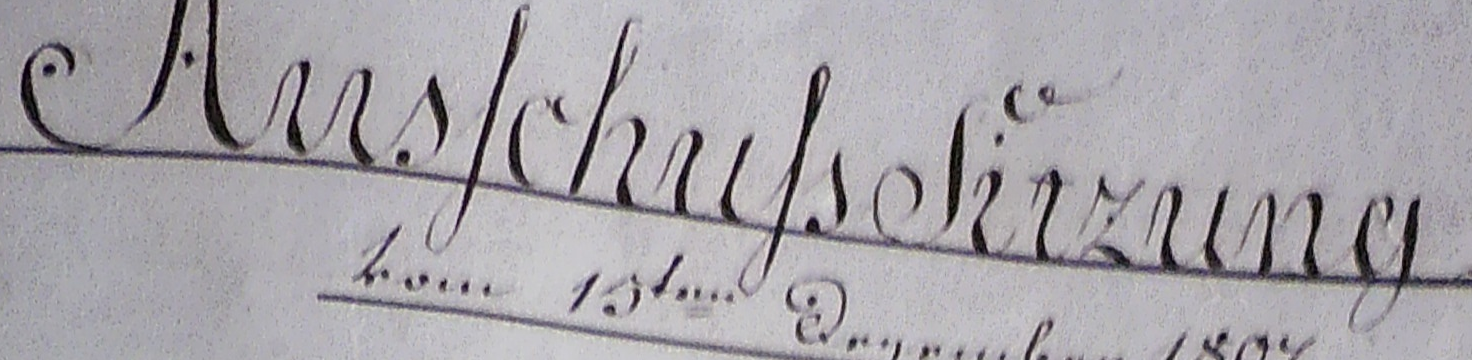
Ausschuss Sitzung
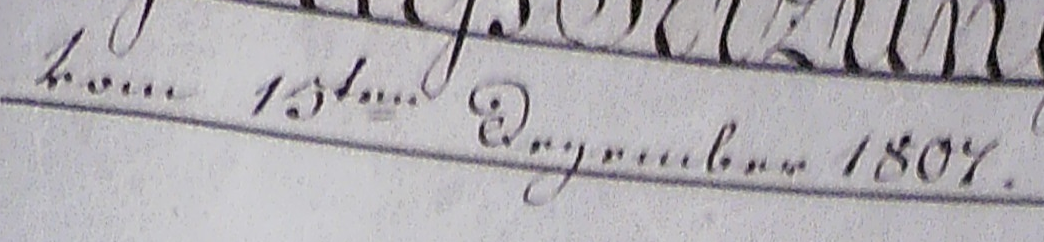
vom 15te͇n Dezember 1807.
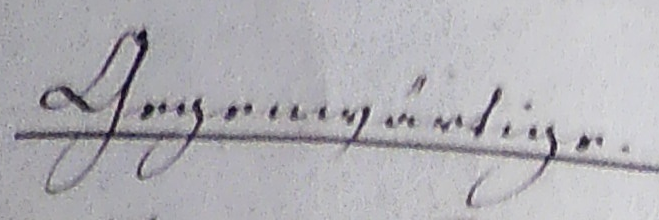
Gegenwärtige.
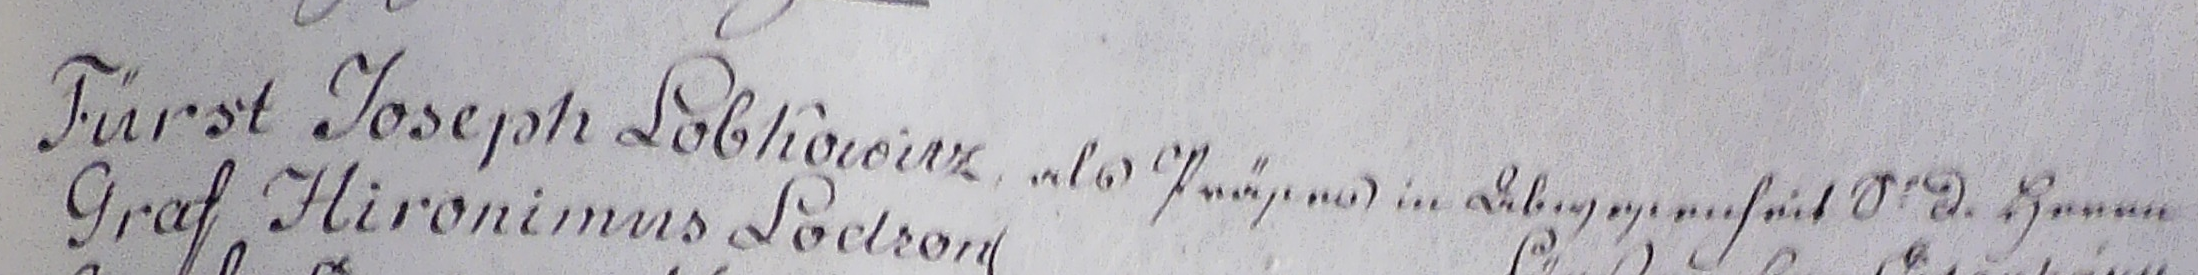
Fürst Joseph Lobkowitz als Präses in Abwesenheit Se͇ d. Herrn
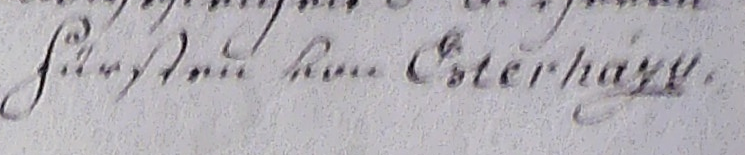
Fürsten von Esterházy.
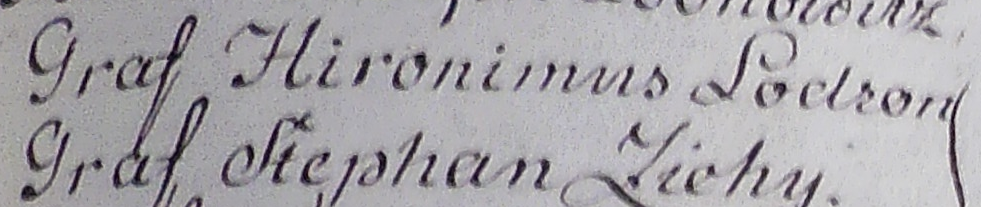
Graf Hironimus Lodron
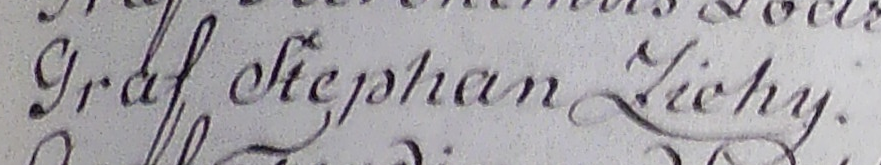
Graf Stephan Zichy.
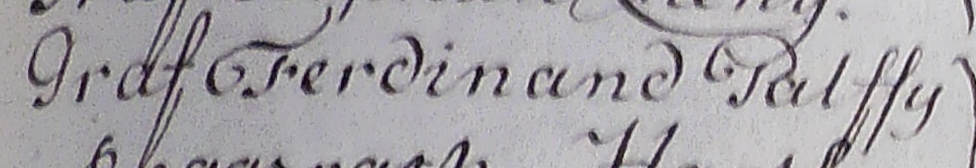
Graf Ferdinand Palffy
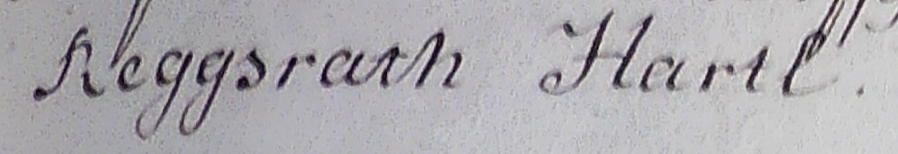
Reggsrath Hartl.
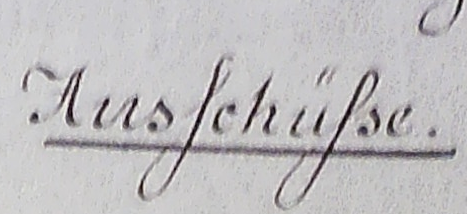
Ausschüsse.
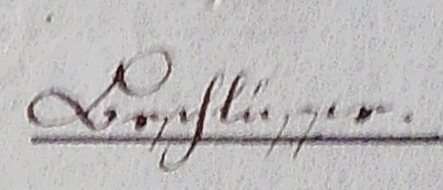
Beschlüsse.
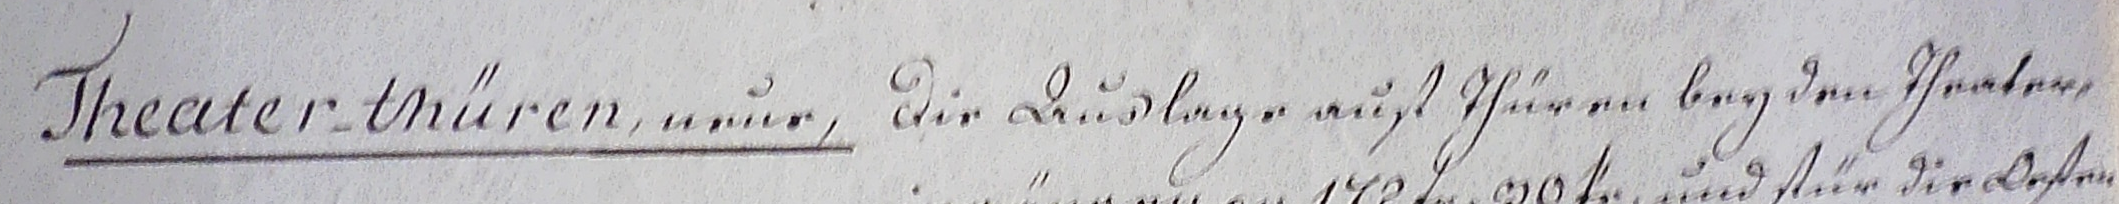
Theater_thüren, neue, Die Auslage auf Thüren bey den Theater¬
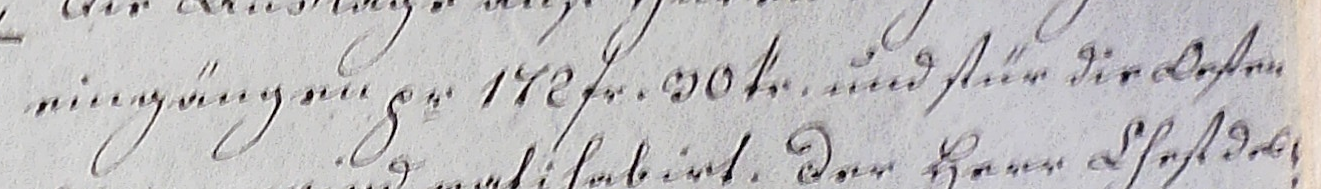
eingängen pr͇ 172fr. 30kr, und für die Oefen
